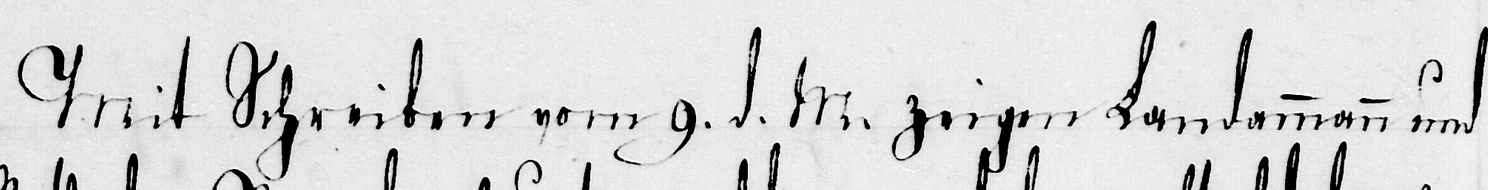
Mit Schreiben vom 9. d. M. zeigen Landammann und
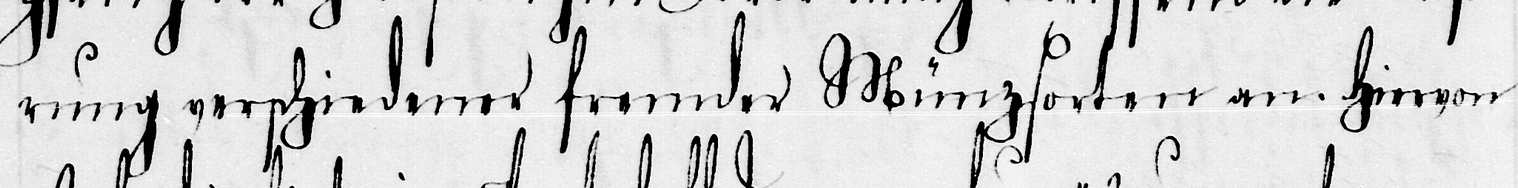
rung verschiedener fremder Münzsorten an. Hiervon
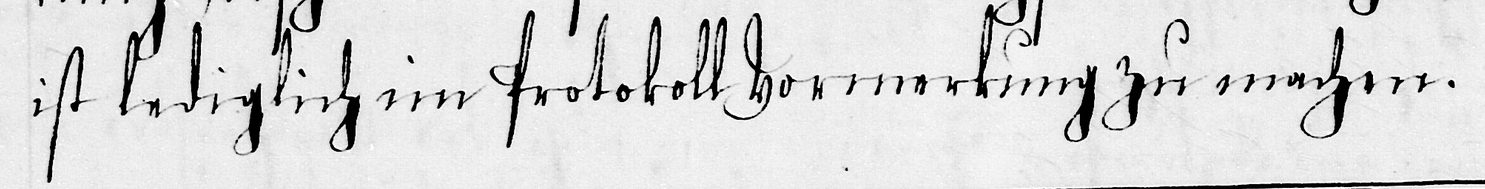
ist lediglich im Protokoll Vormerkung zu machen.
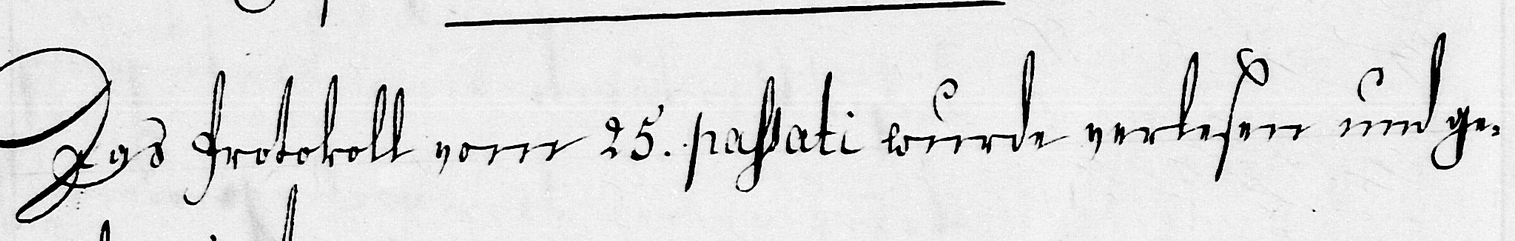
Das Protokoll vom 25. passati wurde verlesen und ge¬
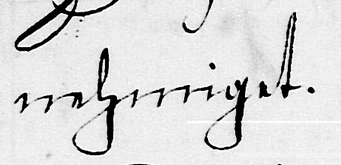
nehmiget.
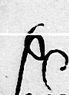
sc¬
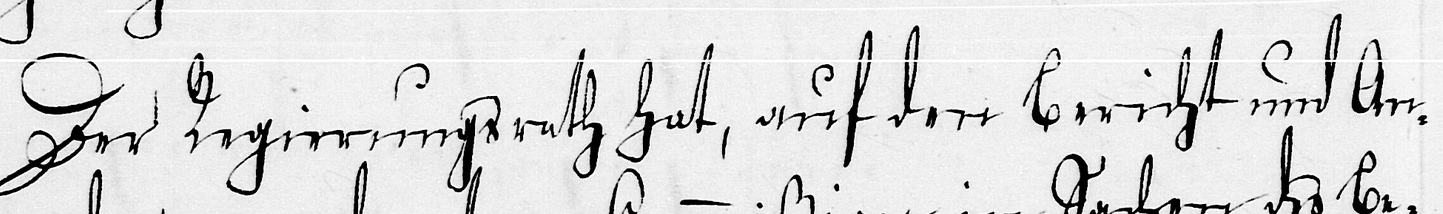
Der Regierungsrath hat, auf den Bericht und An¬
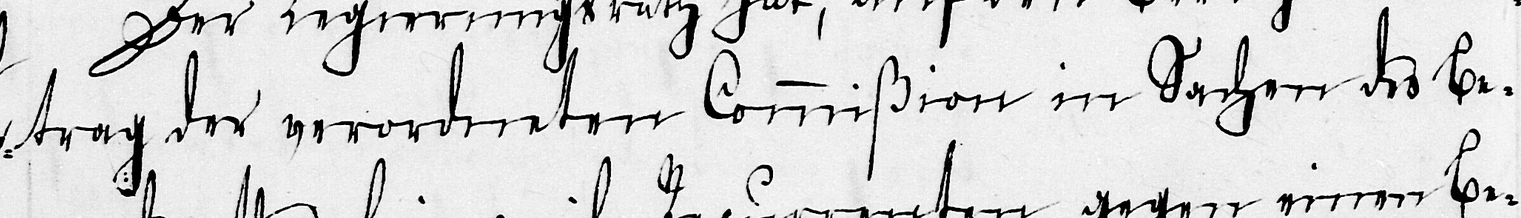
trag der verordneten Commißion in Sachen des Be¬
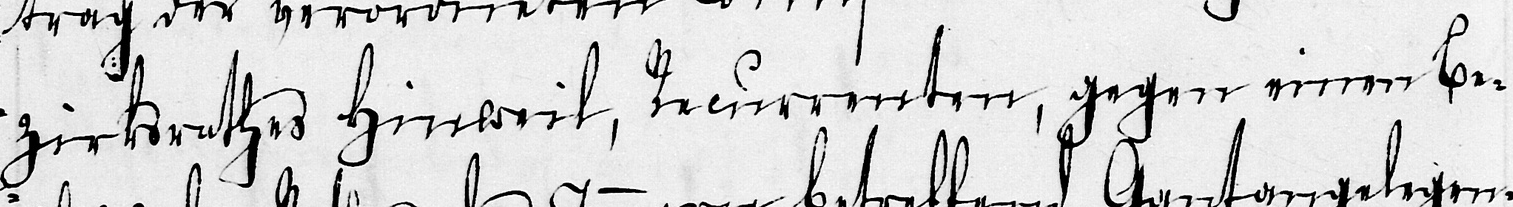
zirksrathes Hinweil, Recurrenten, gegen einen Be¬
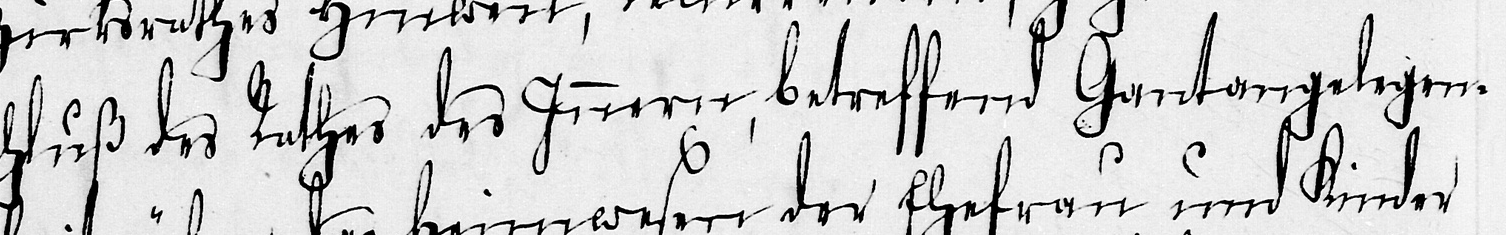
hluß des Rathes des Innern, betreffend Gantangelegen¬
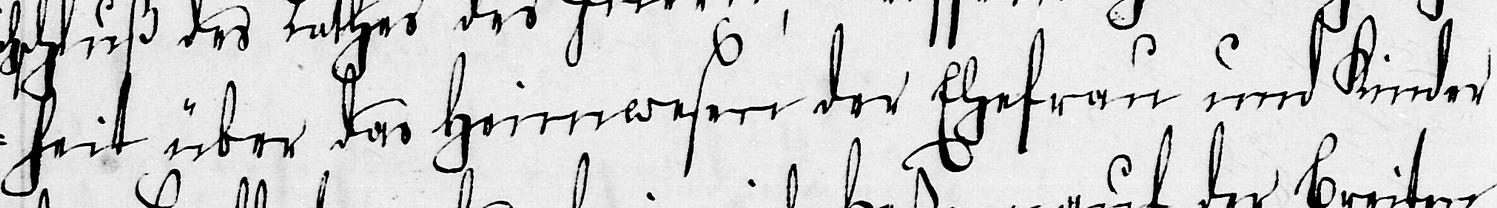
heit über das Heimwesen der Ehefrau und Kinder
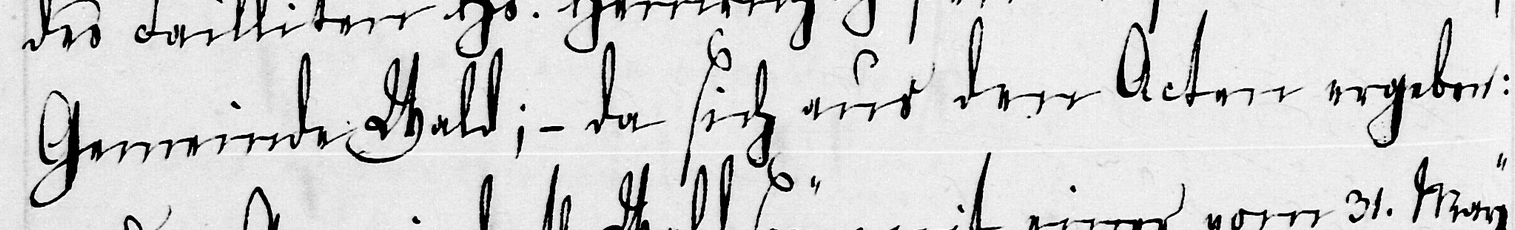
Gemeinde Wald; – da sich aus den Acten ergeben:
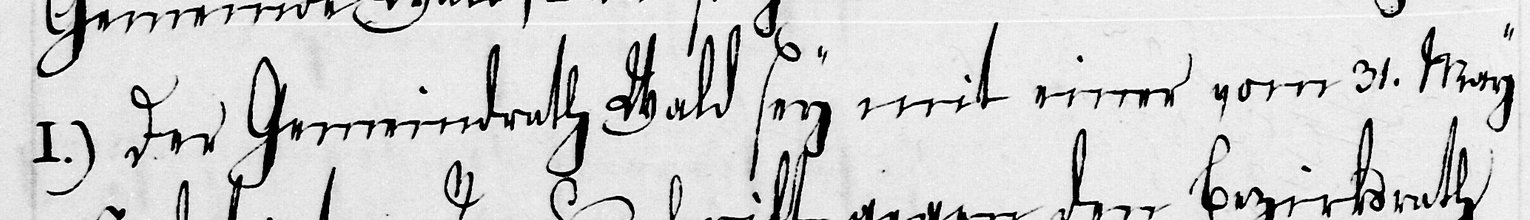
I.) Der Gemeindrath Wald sey mit einer vom 31. May
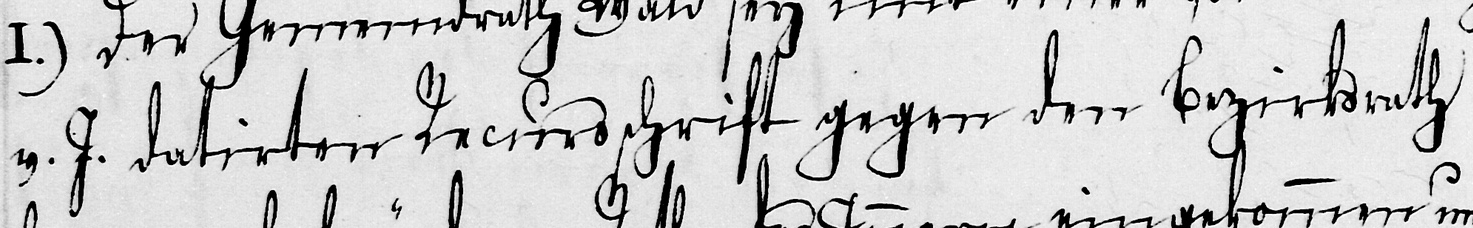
v. J. datirten Recursschrift gegen den Bezirksrath
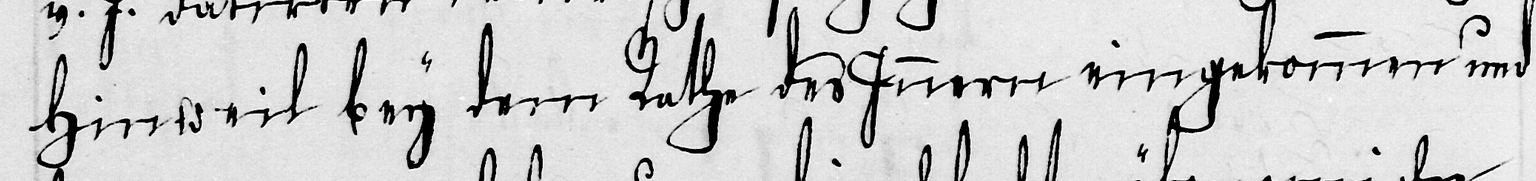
Hinweil bey dem Rathe des Innern eingekommen und
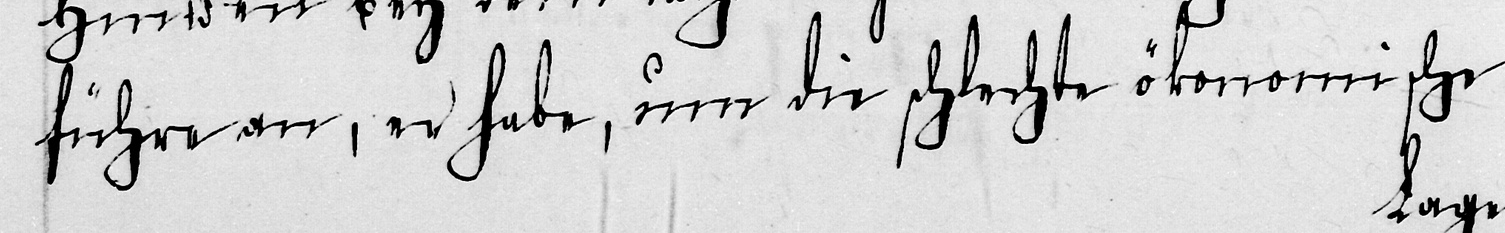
führe an, er habe, um die schlechte ökonomische
